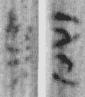斯B（斯）
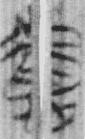○（怚）
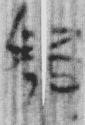矣
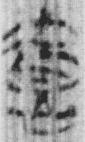○（怚）
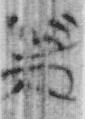斯B（斯）
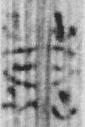莫
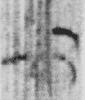与
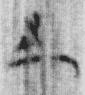之
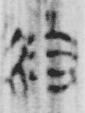结
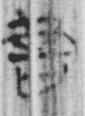○（慎）
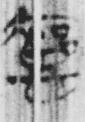慮
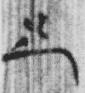之
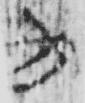方
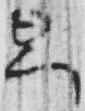也
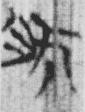肰（然）
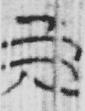而
